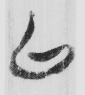㠯（以）
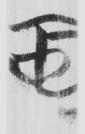𠁩
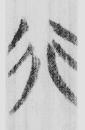行
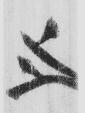之
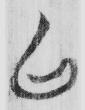㠯（以）
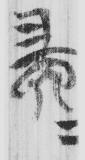耑=
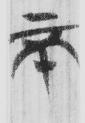不
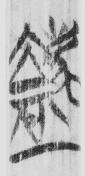{盍廌}
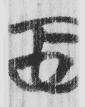𠁩
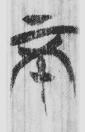不
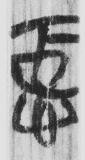忠
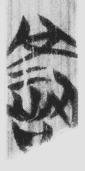罰
